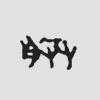朕
